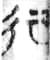行
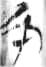币（師）
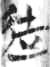徒
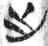出
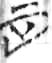正（征）
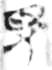○（得）
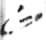㠯（以）
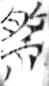祭
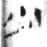少（小）
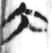大
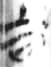吉
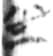生
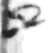子
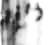男
